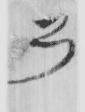乃
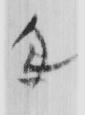身
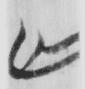亡
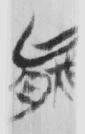能
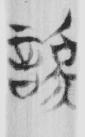{言象}
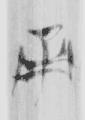甬
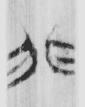非
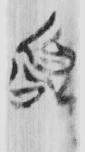頌
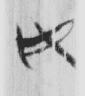女
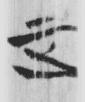正
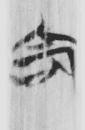命
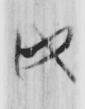女
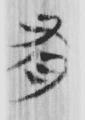有
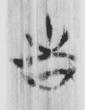告
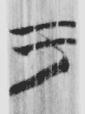于
